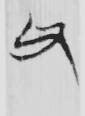父
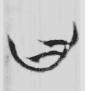曰
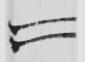二
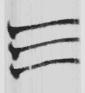三
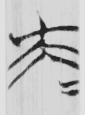夫=
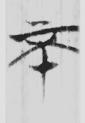不
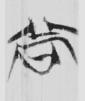尚
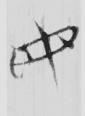母
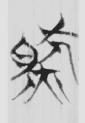然
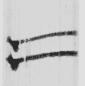二
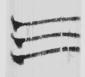三
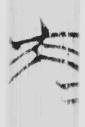夫=
